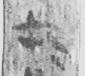七十=
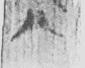八
